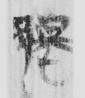{邑日虫}
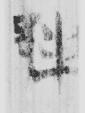邦
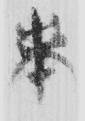未
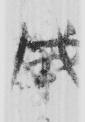成
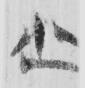少
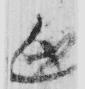臣
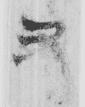又
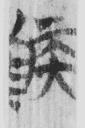疾
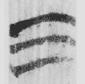三
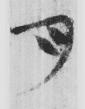月
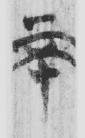不
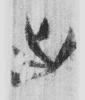出
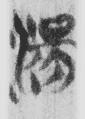湯
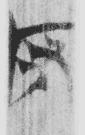反
